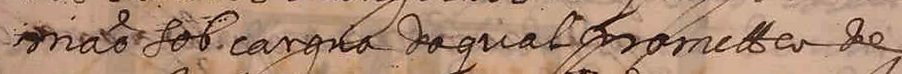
maõ sob carguo do qual prometteo de
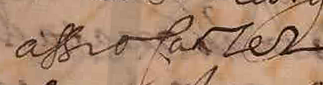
assi o fazer
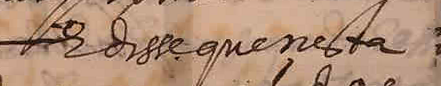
E disse que nesta
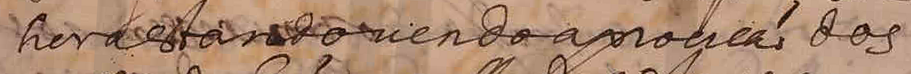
hora estando uendo a procicaõ dos
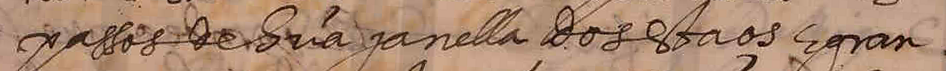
passos de huā janella dos estaos E gran
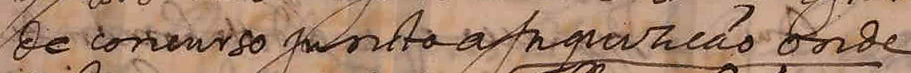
de concurso juncto a Jnquiziçaõ onde
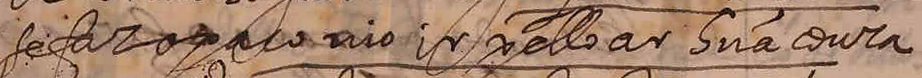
se faz o paço uio ir pello ar huā couza
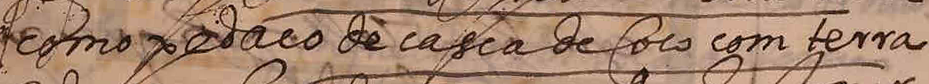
como pedaco de casca de Coco com terra
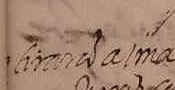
tiraraõ a ima
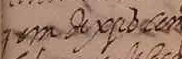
gem de xpō com
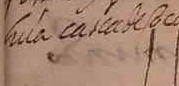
huā casca de coco
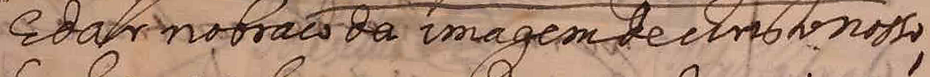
E dar no braco da imagem de christo nosso
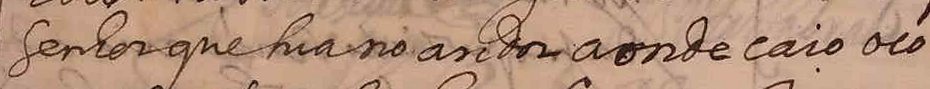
senhor que hia no andor aonde caio o cō
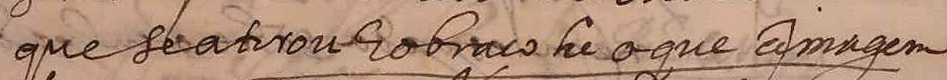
que se atirou E o braço he o que a Jmagem
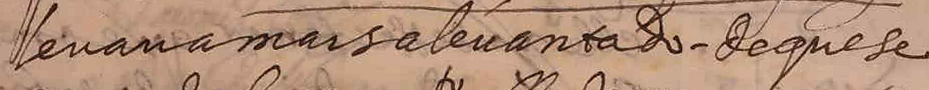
leuaua mais aleuantado de que se
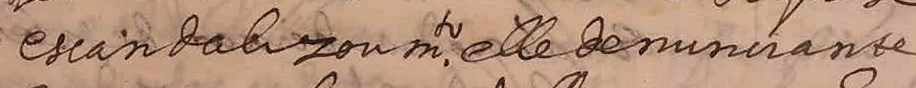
escandalizou m.to elle denunciante
